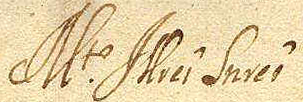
M.to Illres̄ Snres̄
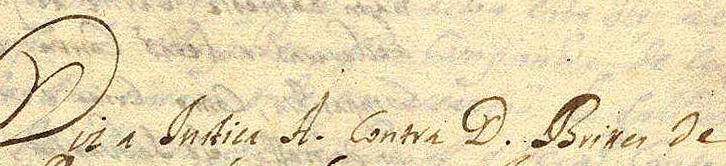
Diz a Iustiça A. Contra D. Brittes de
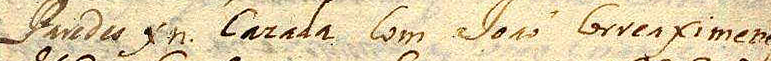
Paredes x n. Cazada Com Ioaõ Correa Ximenes
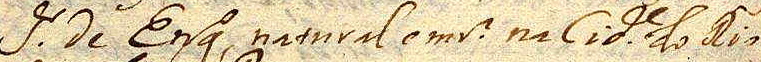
S.or de Engo, natural e mr.a na Cid.e do Rio
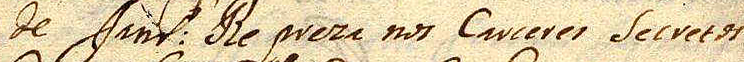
de Janro: Re preza nos Carceres Secretos
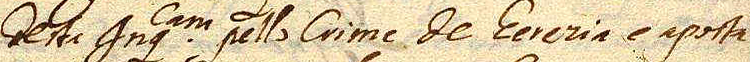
desta Inqcam. pello Crime de herezia e aposta
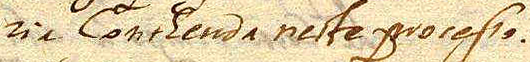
zia, Contheuda neste processo.
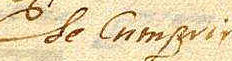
E se Cumprir.
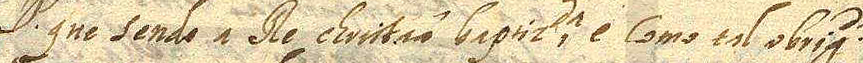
P. que sendo a Re christaã baptizda, e como tal obrig.da
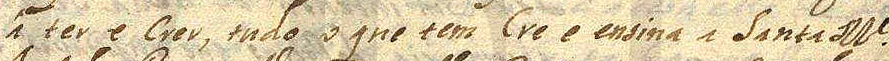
a ter e crer, tudo o que tem Cre e ensina a Santa Me.
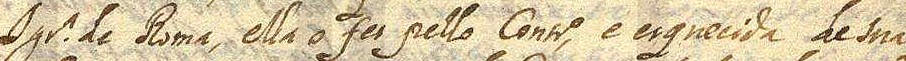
Igr.a de Roma, ella o fes pello Contro, e esquecida de sua
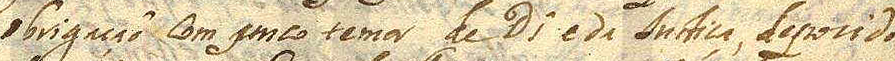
obrigaçaõ com pouco temor de Ds̄ e da Iustiça, depois do
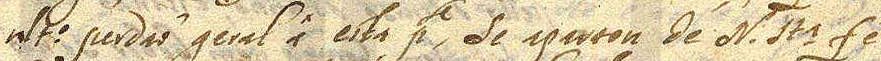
ult.o perdaõ geral â esta pte, se apartou de N. St.a fê
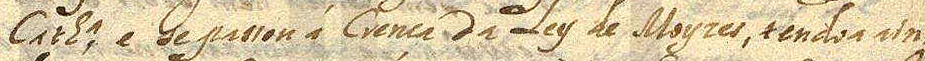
Catha, e se passou á Crença da Ley de Moyzes, tendoa ain
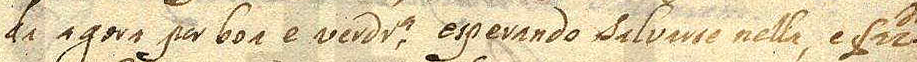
da agora por boa e verdra, esperando salvarse nella, e faz.do
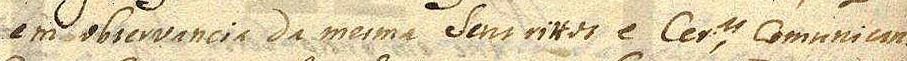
em observancia da mesma Seus rittos e Cer.as, Comunican
